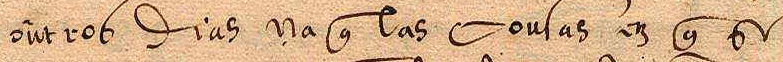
outros dias naq̅las Cousas em q̅ se
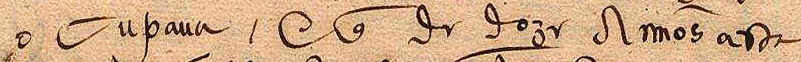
oCupaua / e q̅ de doze Anno̅s a esta
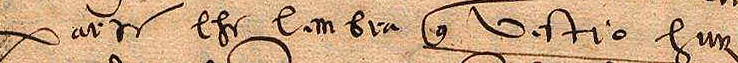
parte lhe lembra q̅ vestio hum
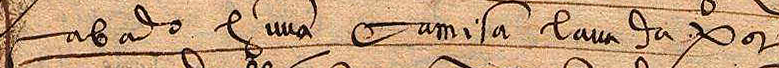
sabado hu̅ua Camisa lauada por
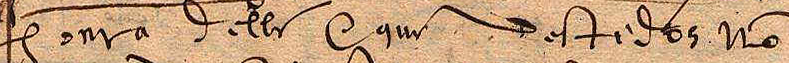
honra delle e q̅ vestidos no̅
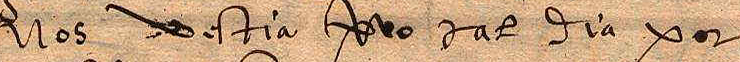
Nos vestia No tal dia por
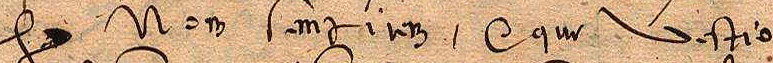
ho Nom semtirem / e que vestio
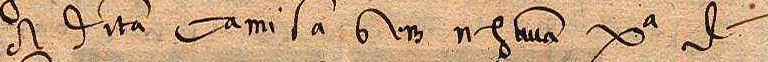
A di̅ta Camisa sem nhu̅ua pa de
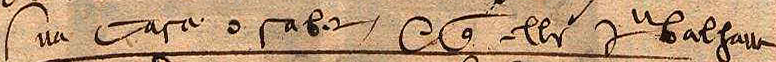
sua Casa o saber / e q̅ elle t̄balhaua
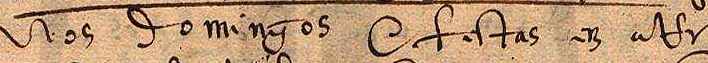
Nos domingos e festas em aRe
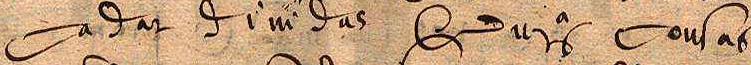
Cadar diuidas e outas Cousas
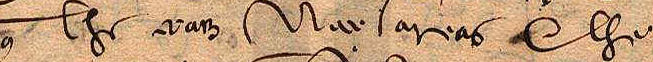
q̅ lhe eram Neçesareas e lhe
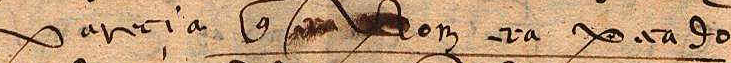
pareçia q̅ era Nom era pecado
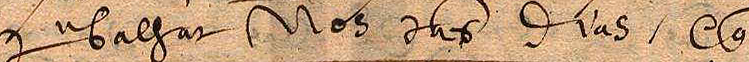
t̄balhar Nos ta̅es dias / e q̅
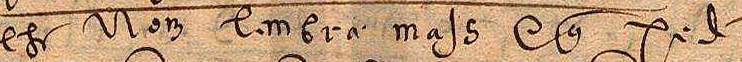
lhe Nom lembra maJs e q̅ pede
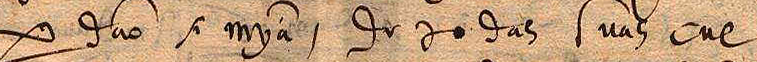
ꝑdão e my̅a / de todas suas cul
